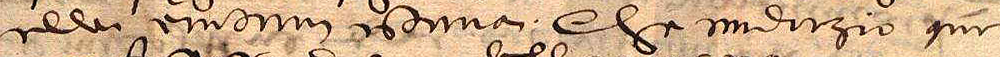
ella emtam estaua. e ha imduzio que
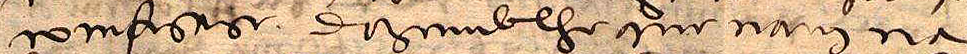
comfesase dizemdolhe que nam era
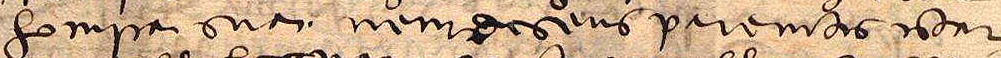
homrra sua. nem de seus paremtes estar
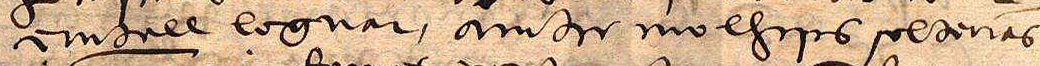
em tall loguar, amtre molheres solteiras
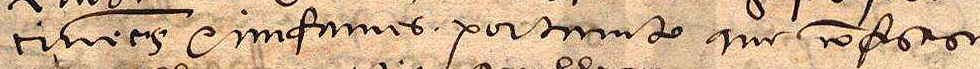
ciuees e imfames. portamto que c̄ofesase
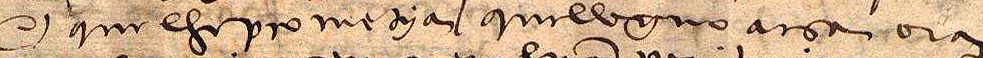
e que lhe prometya que lloguo a esa ora
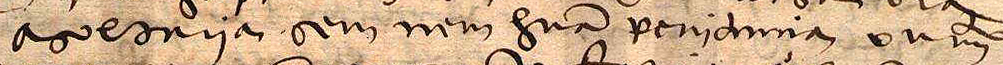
a soltarja sem nem huā penjtencia ou mto
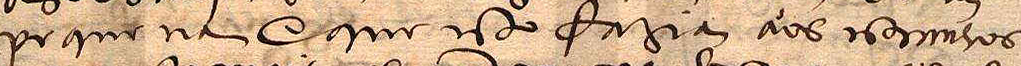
pequena e que esto fazia aos estranhos
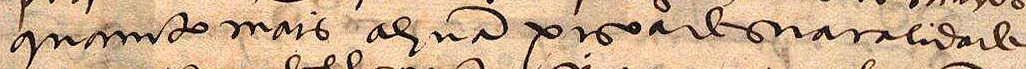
quamto mais a huā pesoa de sua calidade
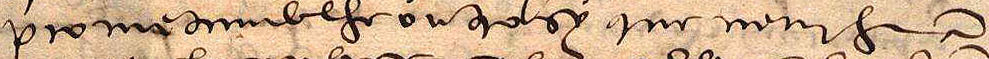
prometemdolhe outrosy que nem huā
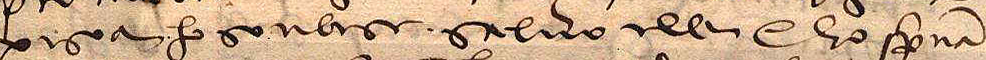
pesoa ho soubese saluo elle e ho sp̄uā
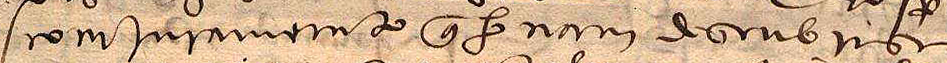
com Juramemto q̄ ho nam descubrise
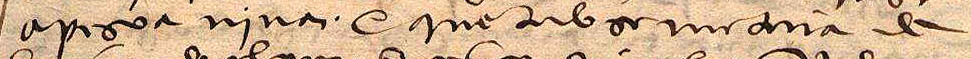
a pesoa ujua. e que todo se meteria de
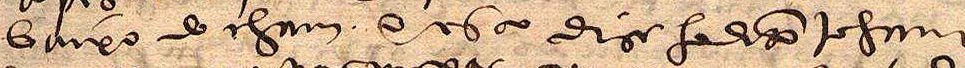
baixo do cham. e esto dise ho dito Joham
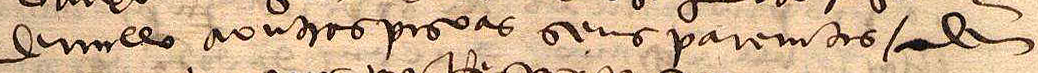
de mello a outras pesoas seus paremtes / de
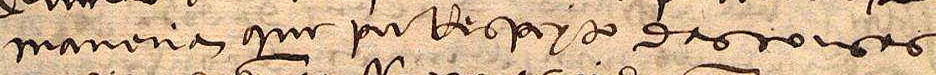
maneira que por Respeyto das cousas
